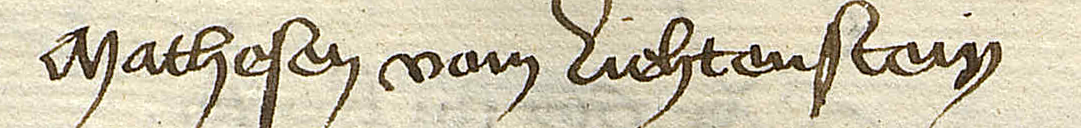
Matheſen von Liehtenſtein
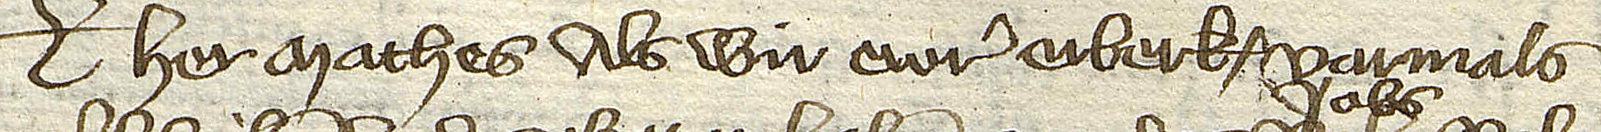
L* her Mathes Als wir ew*r erberk* vormals
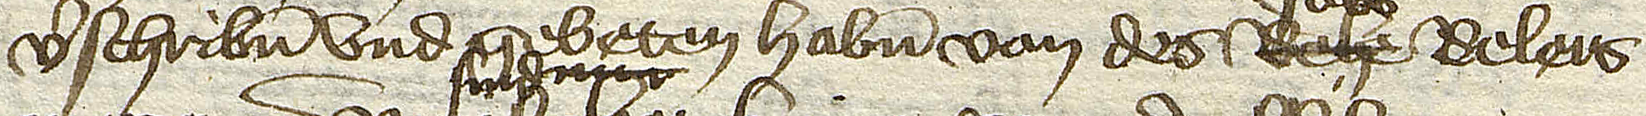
v*ſchrib*n vnd gebeten hab*n von des Behe Belers
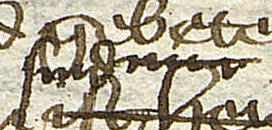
ſind nu
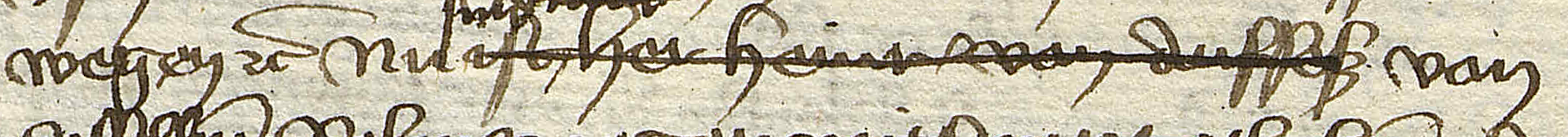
wegen ec* Nu iſt her Heinr* von Aufſeſʒ von
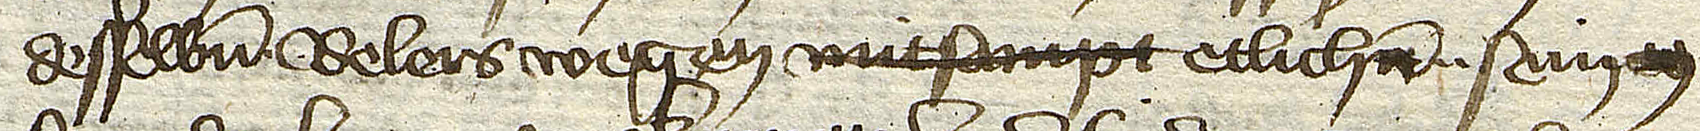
deſſelb*n . Belers wegen mitſampt etlich*n ~ ſeinen
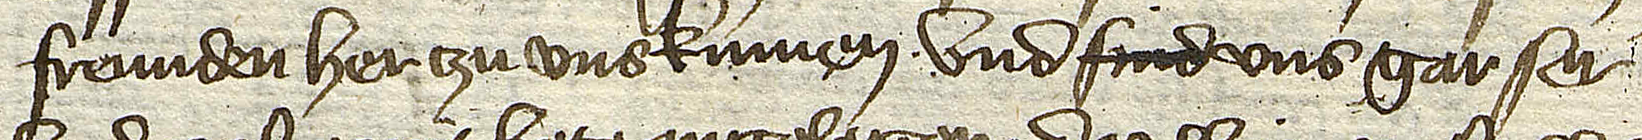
freunden her cʒu vns kumen . Vnd ſind vns gar ſer
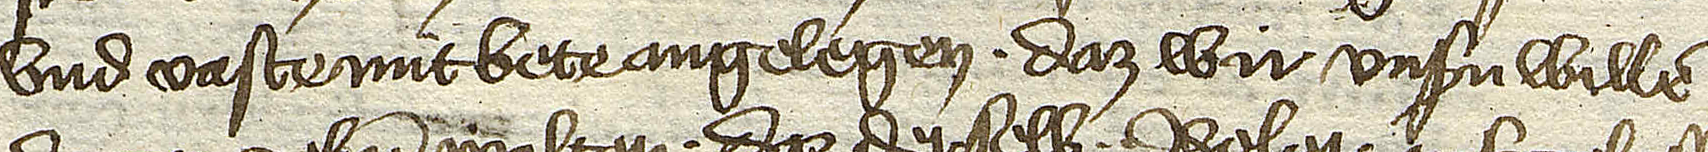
vnd vaſte mit bete angelegen . daʒ wir vnſ*n wille*
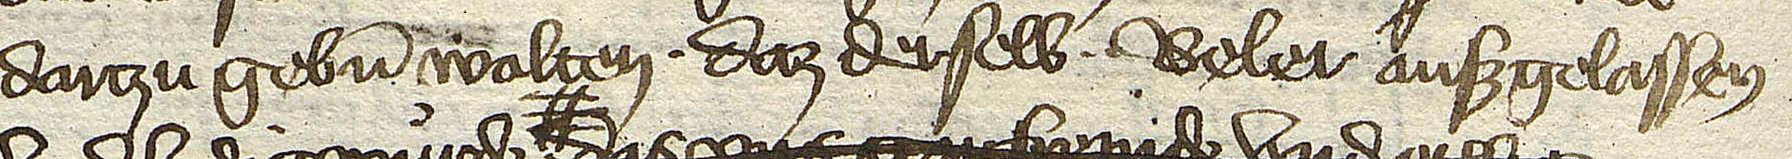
darcʒu geb*n wolten . daʒ derſelb . Beler auſʒgelaſſen
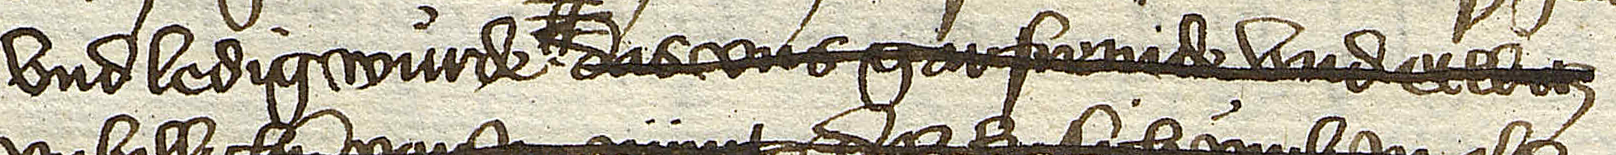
vnd ledig würde das vns gar fremde Vnd etwaʒ
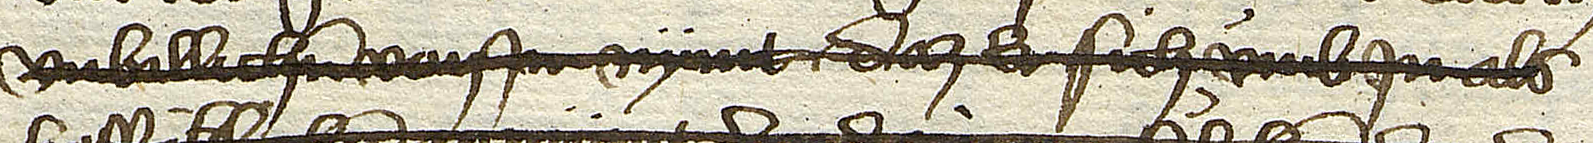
vnbillich*n von Im nymt / Daʒ Er ſich v̈mb In als
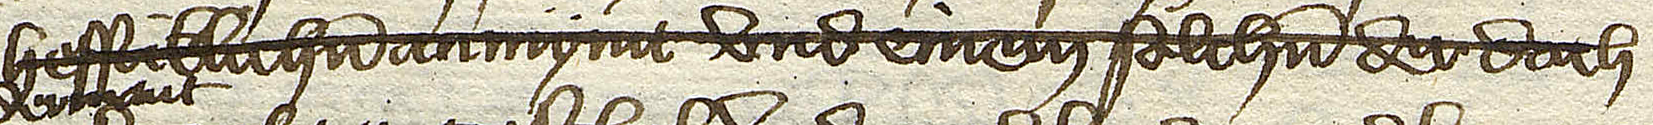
hefftiklich*n annymt vnd einem ſölch*n der doch
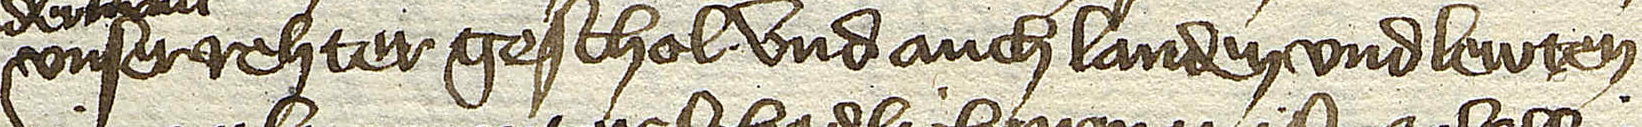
vnſer rehter geſchol . Vnd auch landen vnd lewten
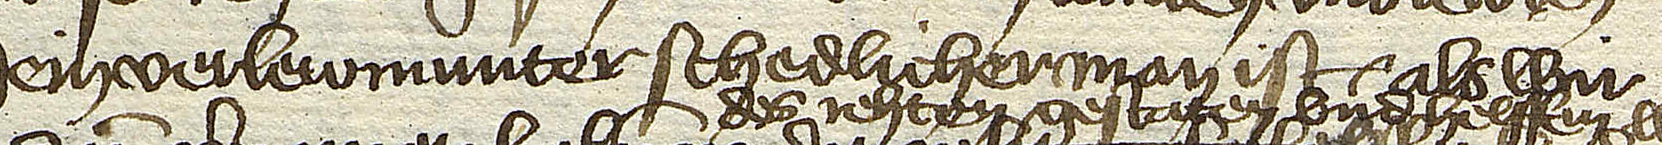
ein verlewmunter ſchedlicher man iſt / als wir
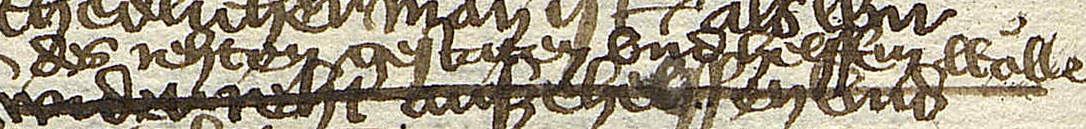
des rehten geſtaten vnd helffen wölle
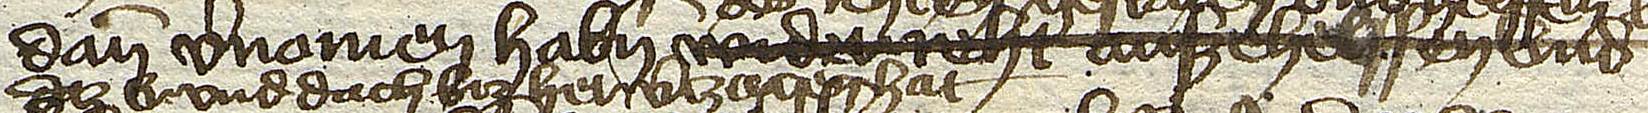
dan* v*nomen hab*n wider reht auſʒehelffen vnd
